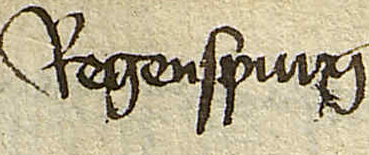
Regenſpurg
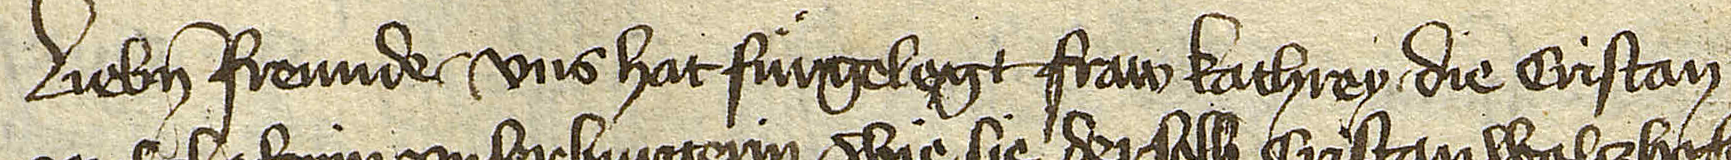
Liebn* freunde / vns hat fürgelegt fraw Kathrey / die Criſtan
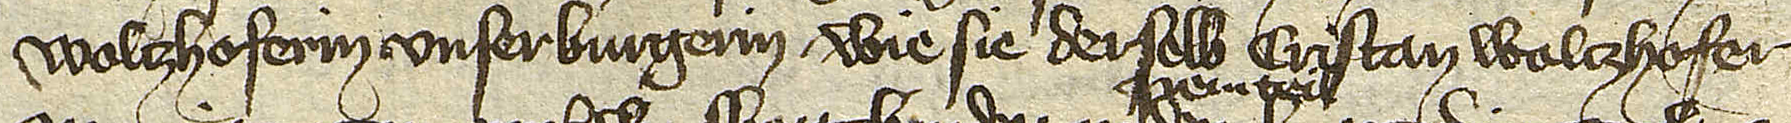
wolcʒhoferun vnſer burgerin / wie ſie derſelb Criſtan wolcʒhofer
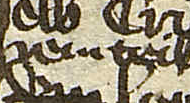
Irem teil
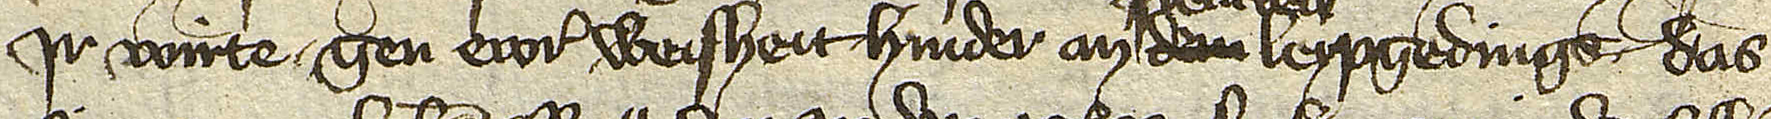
Ir wirte / gen ewr* weiſheit hinder an dem leypgedings / das
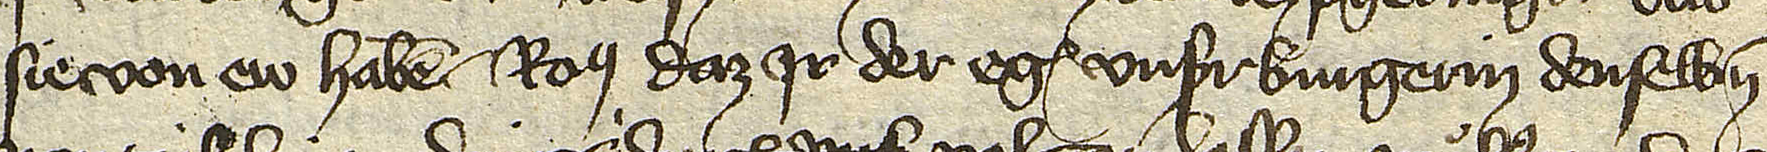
ſie von ew habe* / Ro* daʒ Ir der eg* vnſ*r burgerin denſelbn*
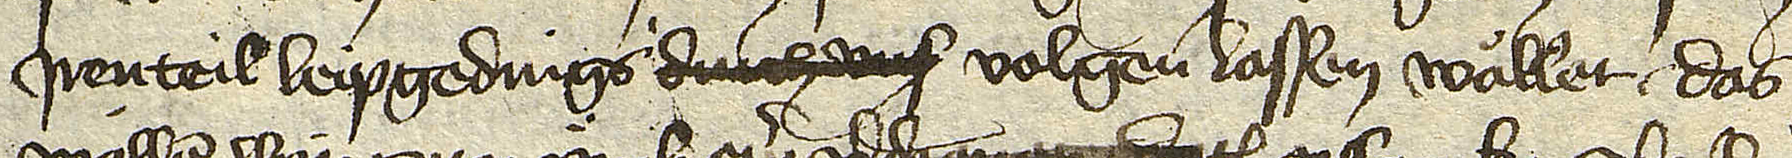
Irenteil leipgedings durch vnſ volgen laſſen wöllet / das
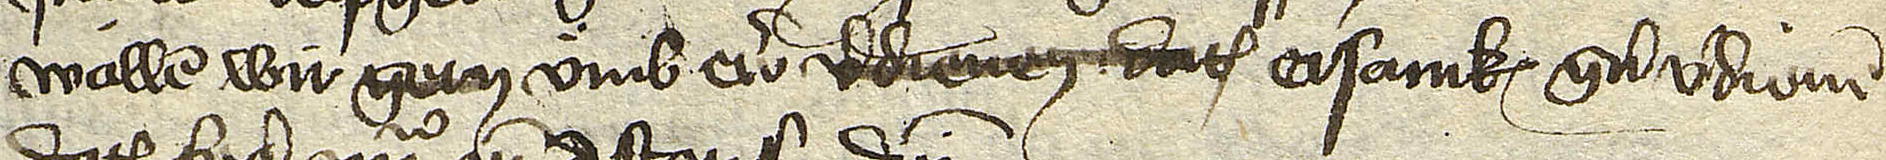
wölle* wir gern v̈mb ew* v*dienen dat* erſamk* gn* v*diene*
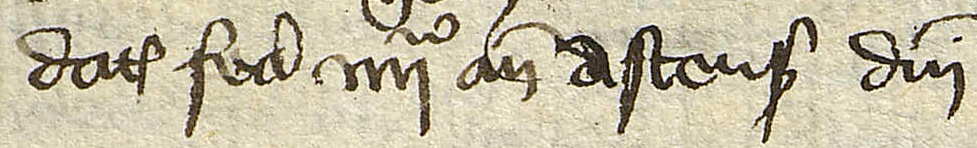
dat* fea* iiii* an* Aſcenſ* dni*
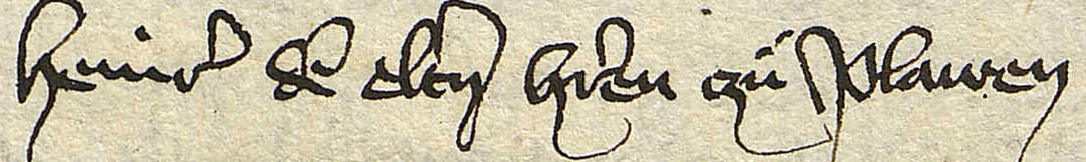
heinr* d* eltn* hr*en cʒü Plawen
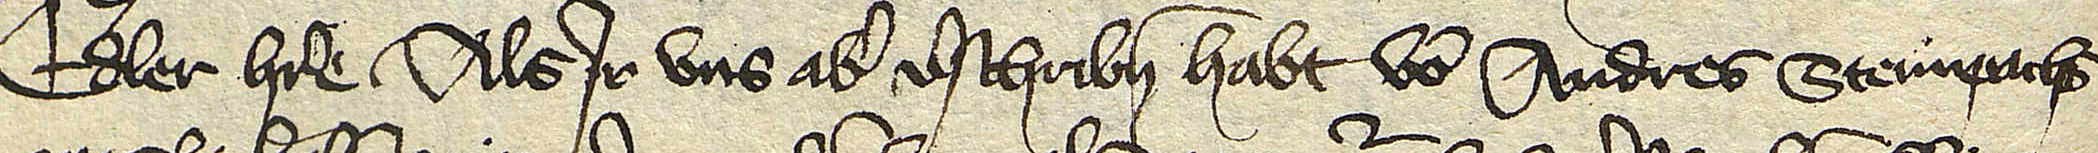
Edler hr*e / Als Ir vns ab* v*ſchribn* habt vo* Andres Steinpachs
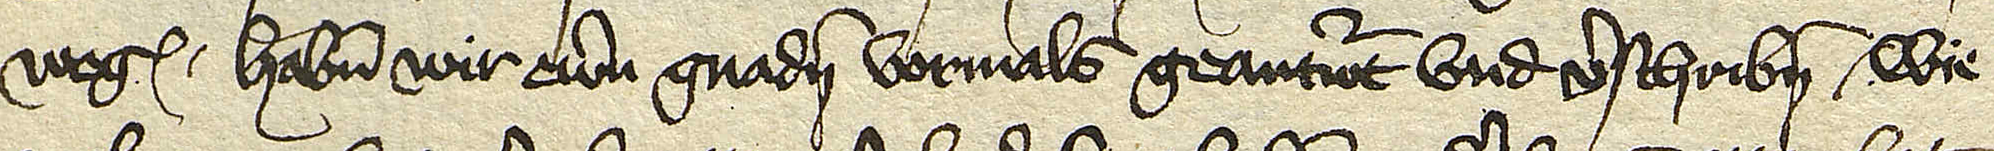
weg* / habn* wir ew*n gnadn* vormals geantw*t* vnd v*ſchribn* / wie
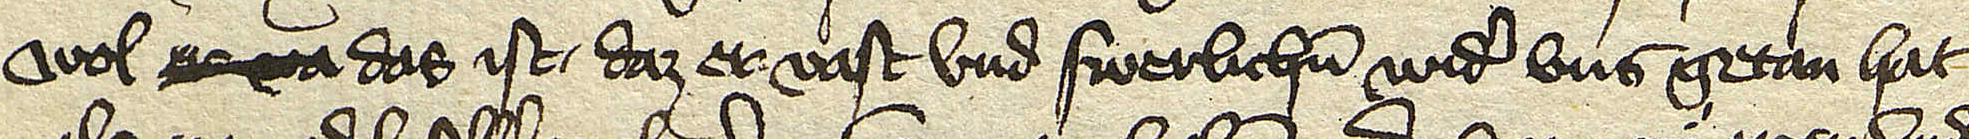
wol er wa das iſt / daʒ er vaſt vnd ſwerlichn* wid* vns getan hat
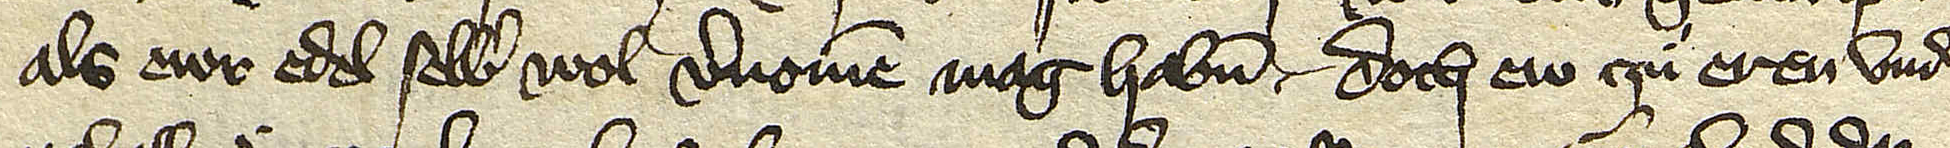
als ewr edel ſelb* wol v*nome* mag habn* / Doch ew cʒü eren vnd
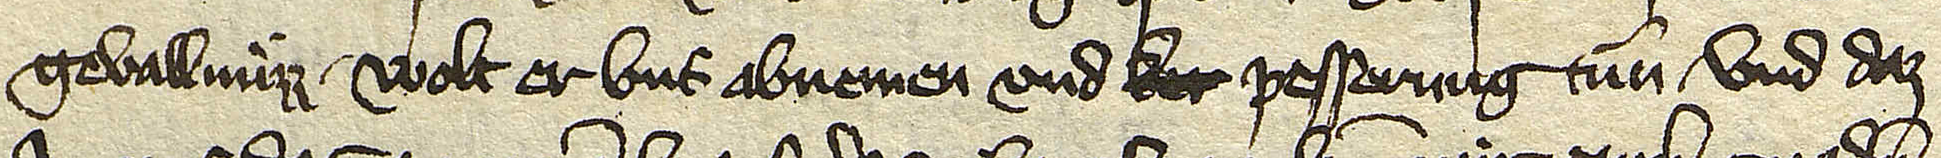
gevallnüʒʒ / wolt er vns abnemen vnd ker peſſerung tün / vnd daʒ
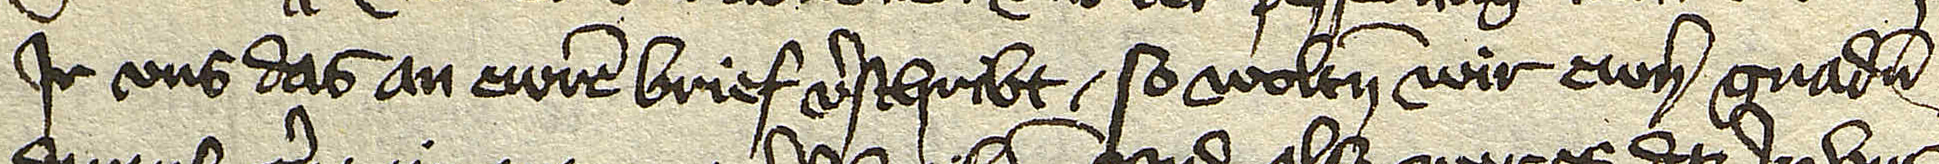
Ir vns das an ewre* brief v*ſchribt / ſo woltn* wir ewn* gnadn*
